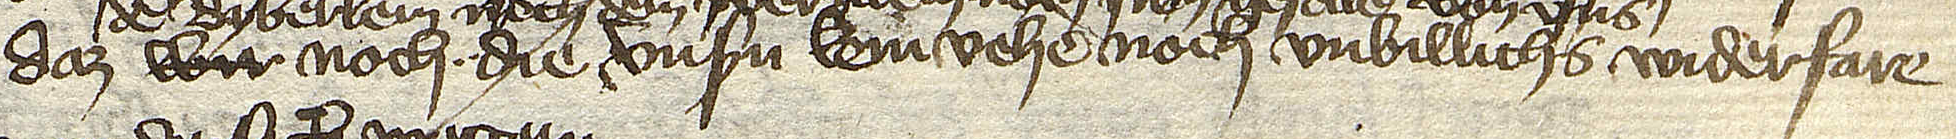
daʒ wir noch ~ die vnſ*n kein vehe noch vnbillichs widerfare
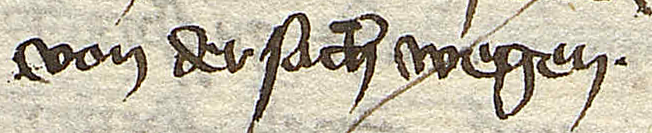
von der ſach wegen .
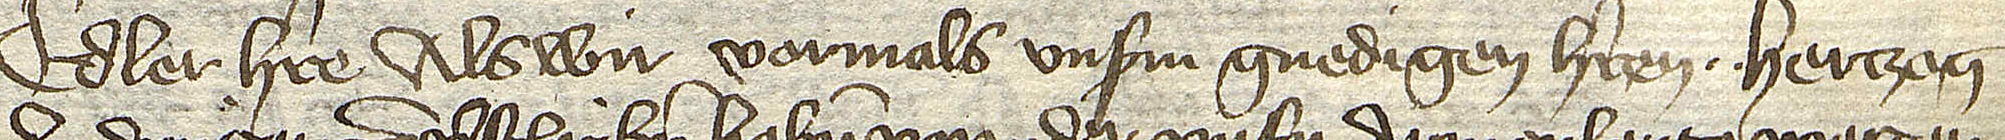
Edler h*re Als wir vormals vnſ*m gnedigen h*ren ~ hercʒog
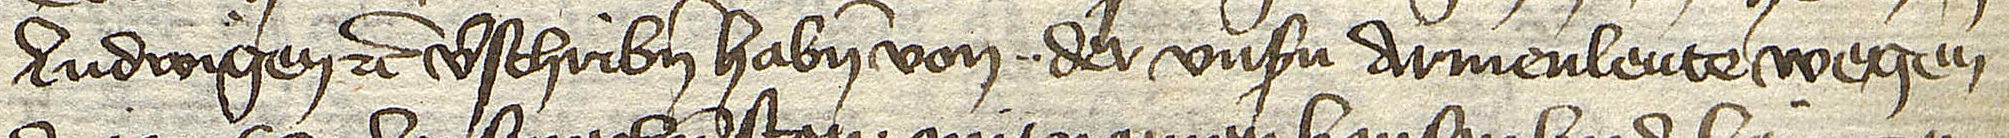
Ludwigen ec* v*ſchribn* habn* von ~ der vnſ*n Armenleute wegen
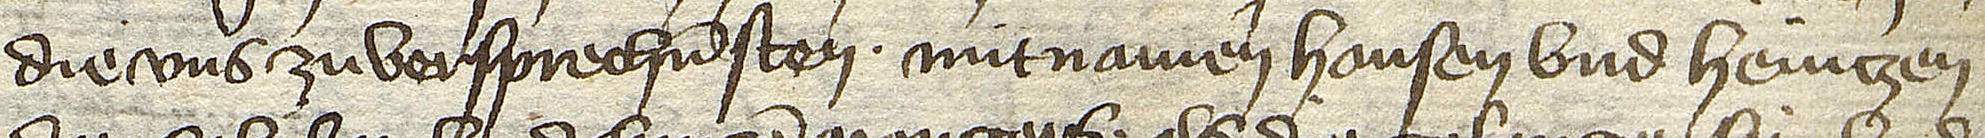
die vns cʒu verſprechn* ſten . mitnamen hanſen vnd heincʒen
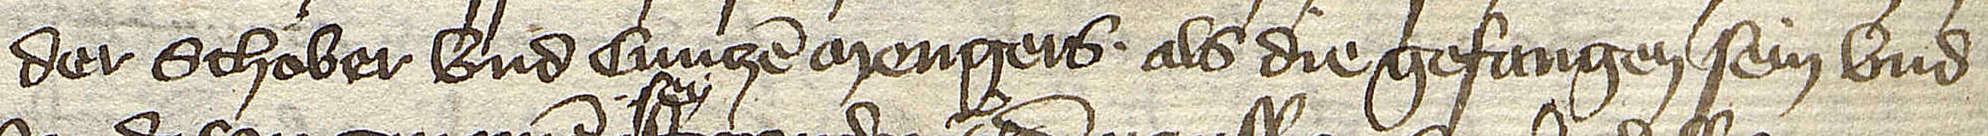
der Schöber vnd Cuncʒe* Mengers . als die gefangen ſein vnd
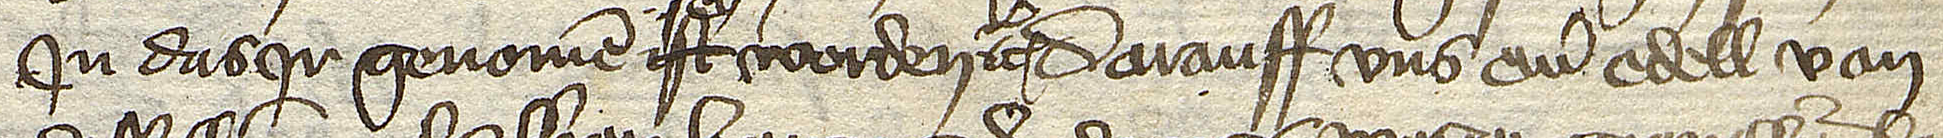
In das Ir genome* iſt worden ec* Darauff vns ew* edell von
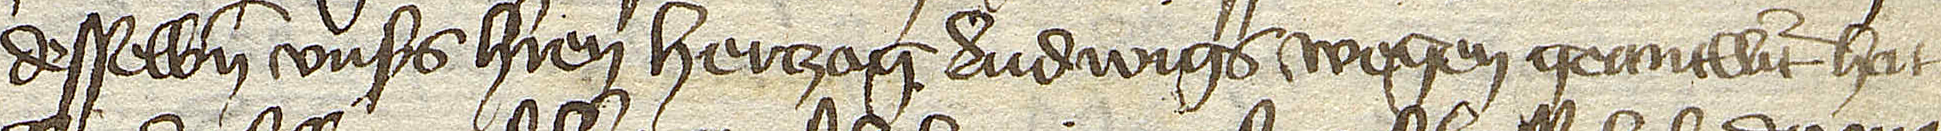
deſſelbn* vnſ*s h*ren hercʒog Ludwigs wegen geantw*t hat
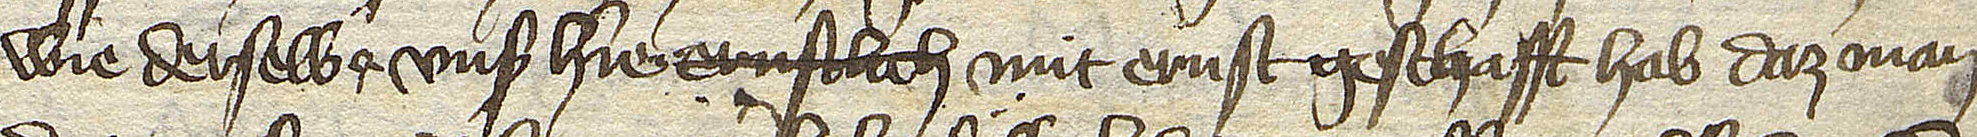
wie derſelb ~ vnſ* h*re ernſtlich mit ernſt geſchafft hab daʒ man
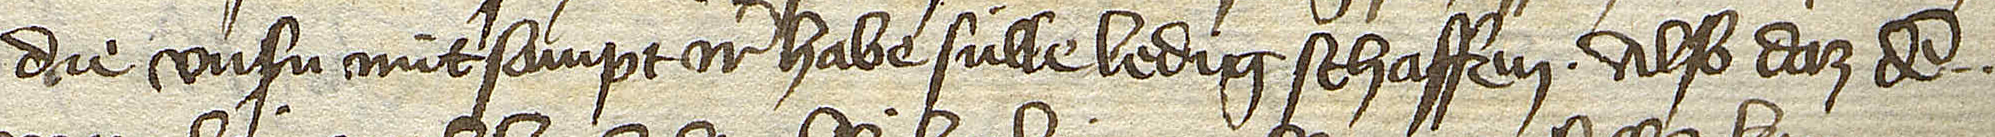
die vnſ*n mitſampt ir* habe ſülle ledig ſchaffen . Alſo daʒ de* ~
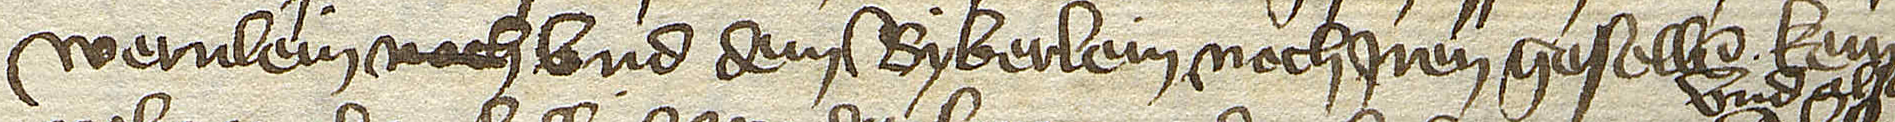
wernlein noch vnd dem Byberlein noch Iren geſelle* kein
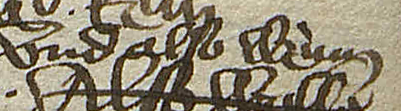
vnd alſo wenn
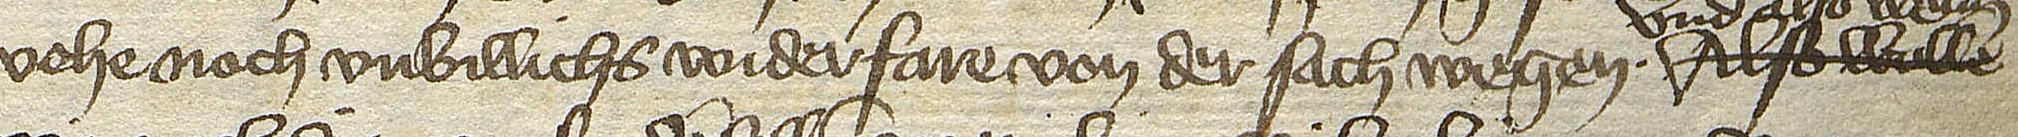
vehe noch vnbillichs widerfare von der ſach wegen . Alſo wolle*
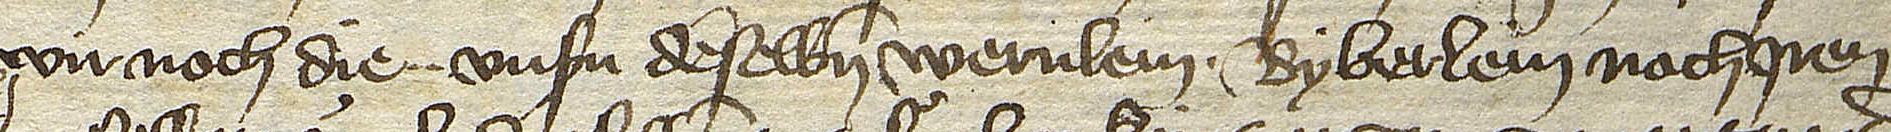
wir noch die ~ vnſ*n de*ſelbn* wernlein . Byberlein noch Iren
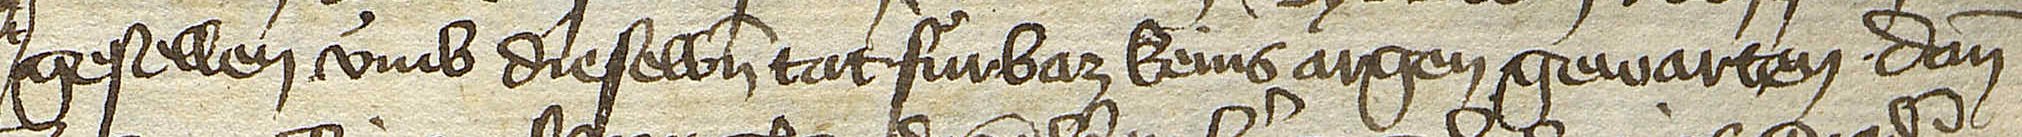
geſellen v̈mb dieſelbn* tat fürbaʒ keins argen gewarten . Dan*
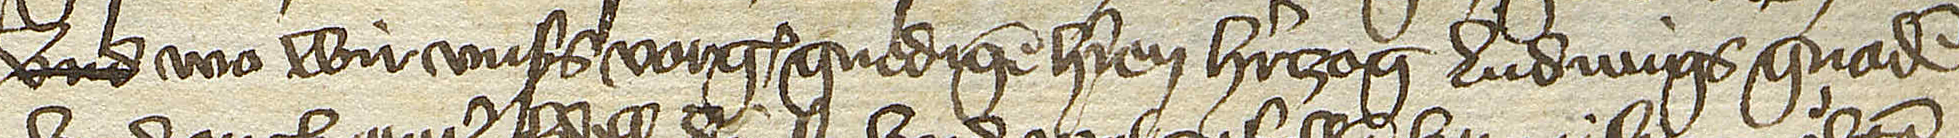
Vnd wo wir vnſ*s vorg* gnedige* h*ren h*rcʒog Ludwigs gnade*
